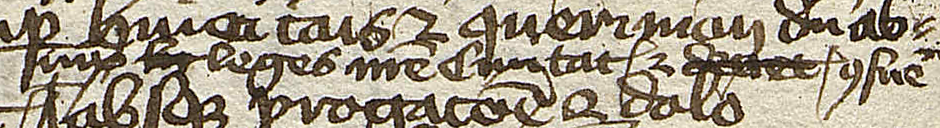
Iux* leges n*re Ciuitat* @ decret* *ſue*
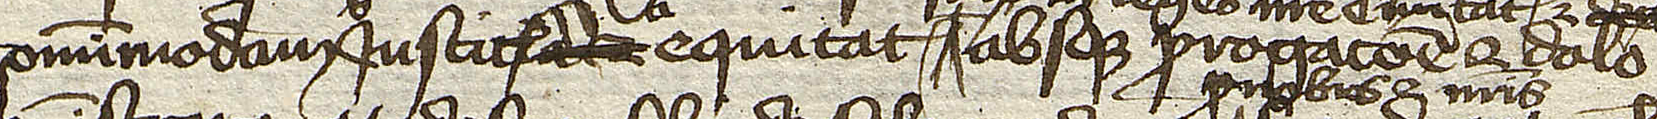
om*imodam Iuſticia* @ equitat* abſq* p*rogac*o*e @ dolo
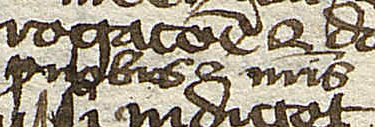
p*nobis @ nris*
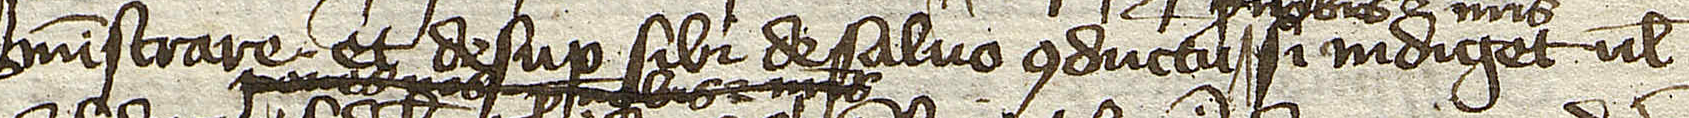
mi*ſtrare et deſuper ſibi deſaluo *ductu ſi indiget u*l
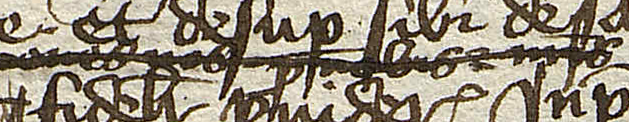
penes nos p*nobis @ nris*
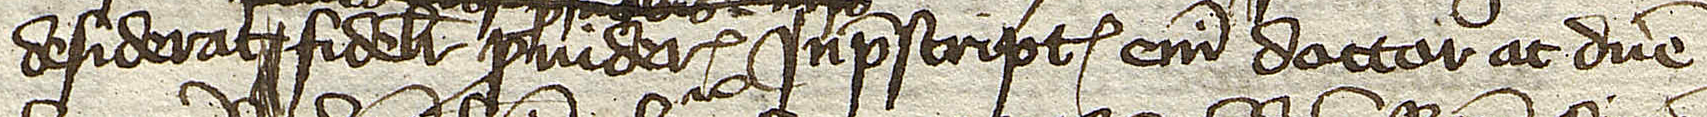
deſiderat* fidel*r p*uider*. Inp*ſcript* eui* doctor ac d*ne
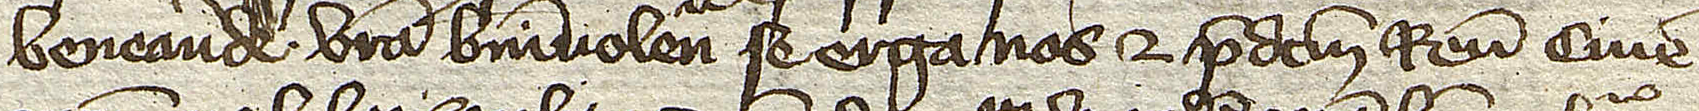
ven*ande v*ra b*nivolen* ſe erga nos @ p*d*c*m Reu* Ciue*
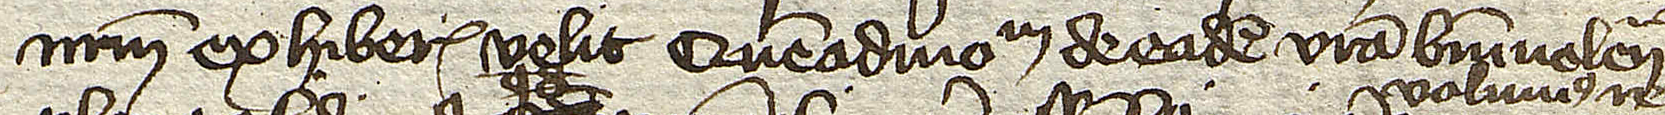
n*r*m ex liber* velit Que*admo*m de ead*m v*ra b*nivolen*
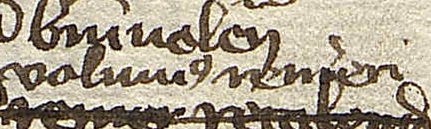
volum* remeri
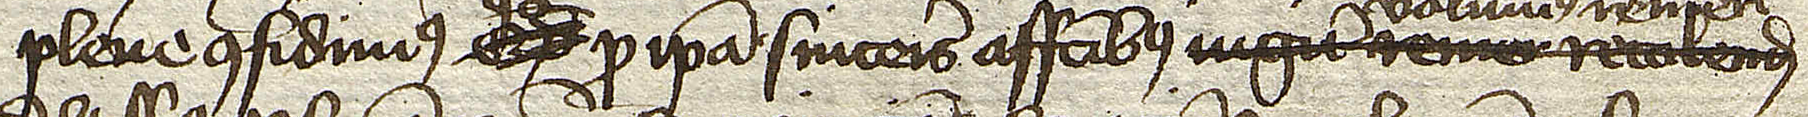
plene *fidim* Qu* p* ip*a ſince*is aff*c*ib* iugit* remer recolend*
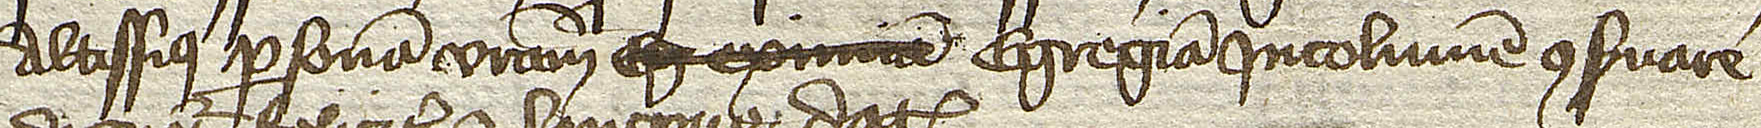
Altiſſi* p*ſona* v*ra Eg exi%%ce* Egregia* Incolume* *ſ*uare
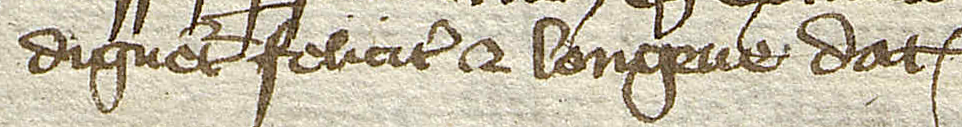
dignet* felicit* @ longue . Dat*
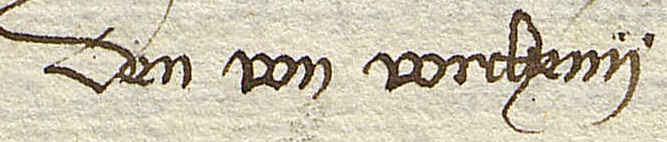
Den von vorcheim
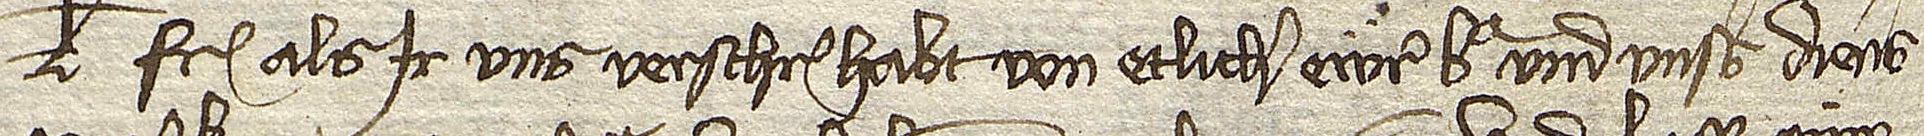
L* fr* als Ir vns verſchr* habt von etlich* eẅr* b* vnd vnſ*s dien*s
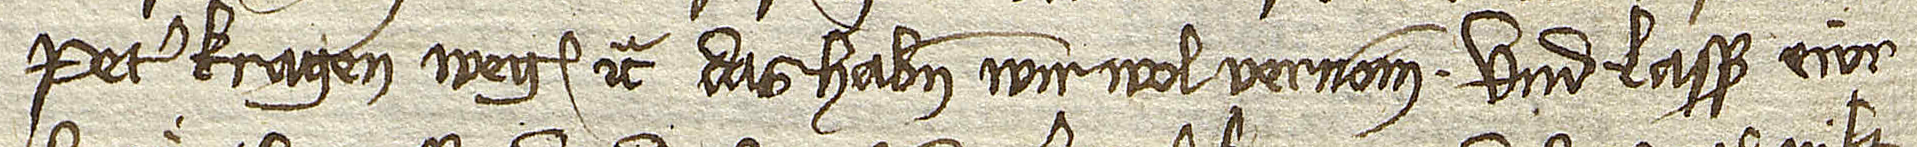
Pet* kragen weg* ec* das habn* wir wol vernom* . Vnd laſſ* eẅr
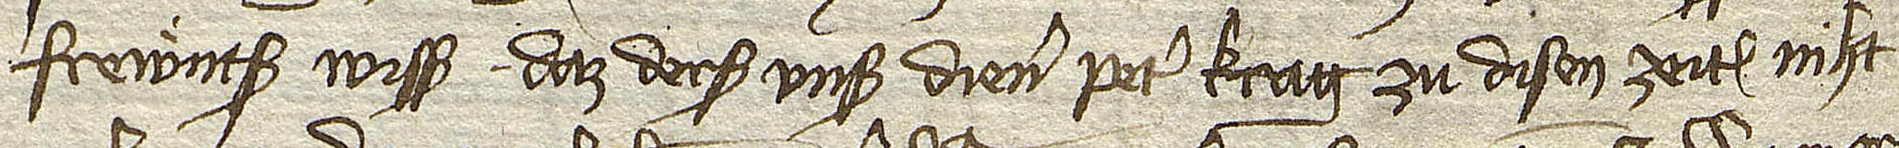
freẅntſ* wiſſ* / daʒ derſ* vnſ* dien* pet* krag ʒu diſen ʒeit* niht
